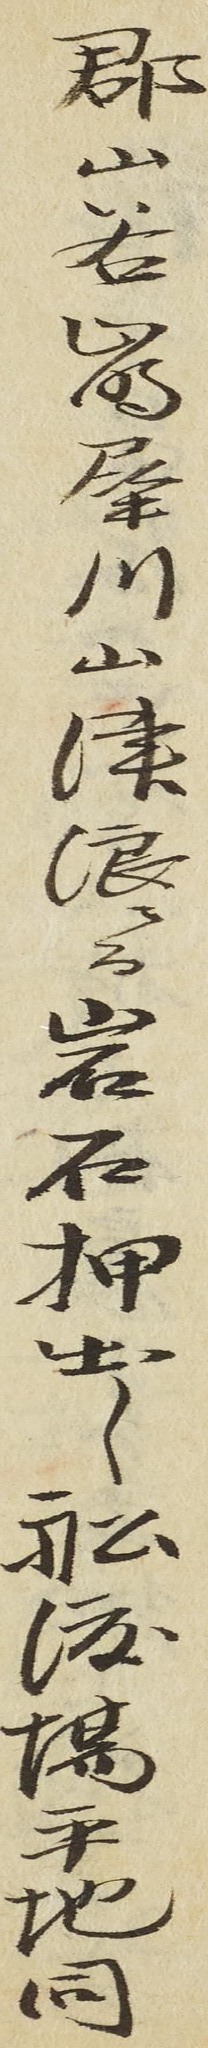郡山谷崩犀川山津浪二而岩石押出し船渡場平地同
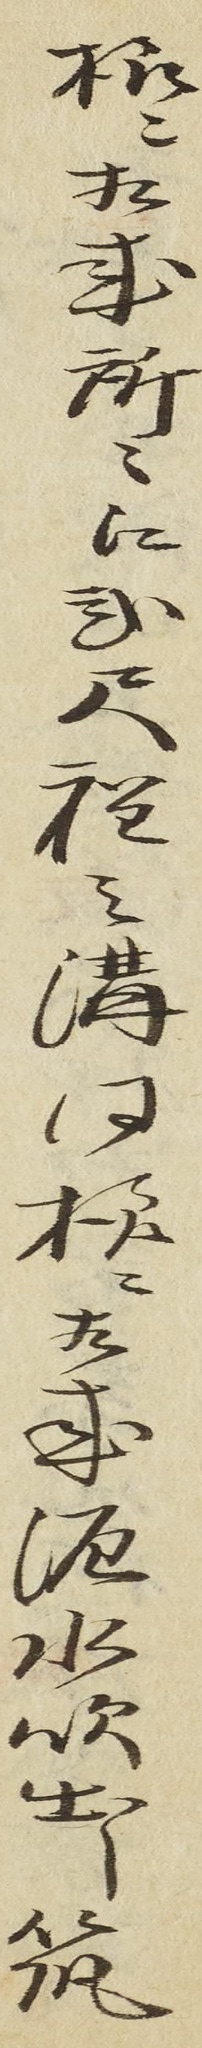様二相成所々江弐尺程之溝同様二相成泥水吹出し筑
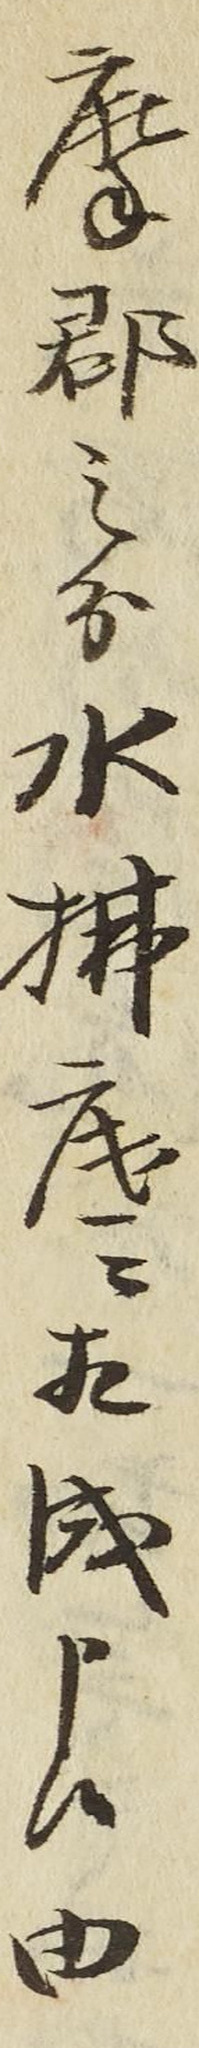摩郡之分水払底二相成申候由
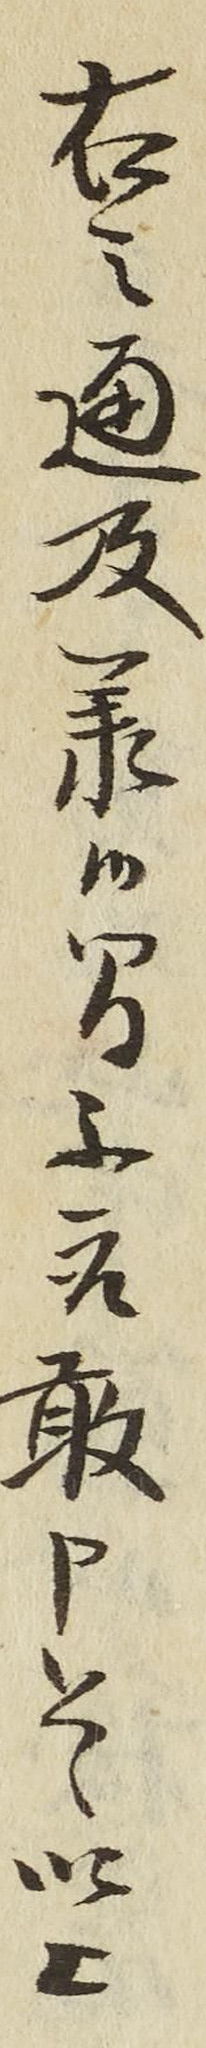右之通及承候間不取敢申上候以上
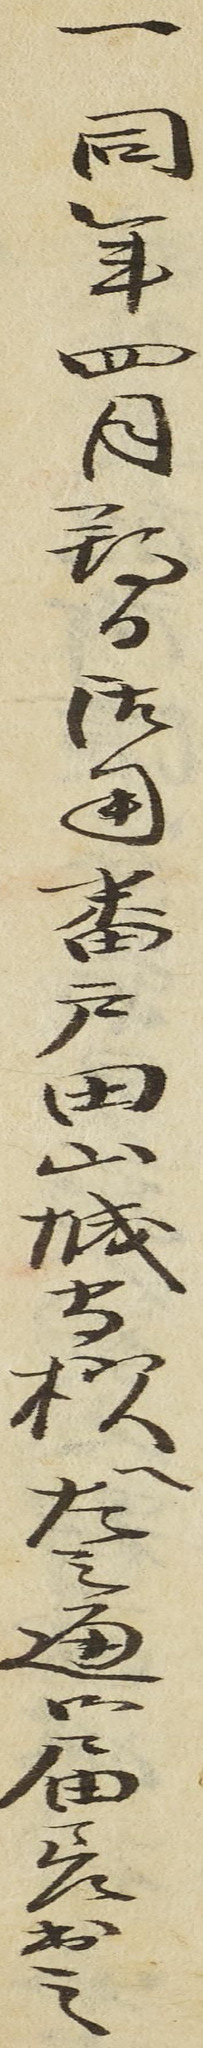一同年四月朔日御用番戸田山城守様へ左之通御届差出之
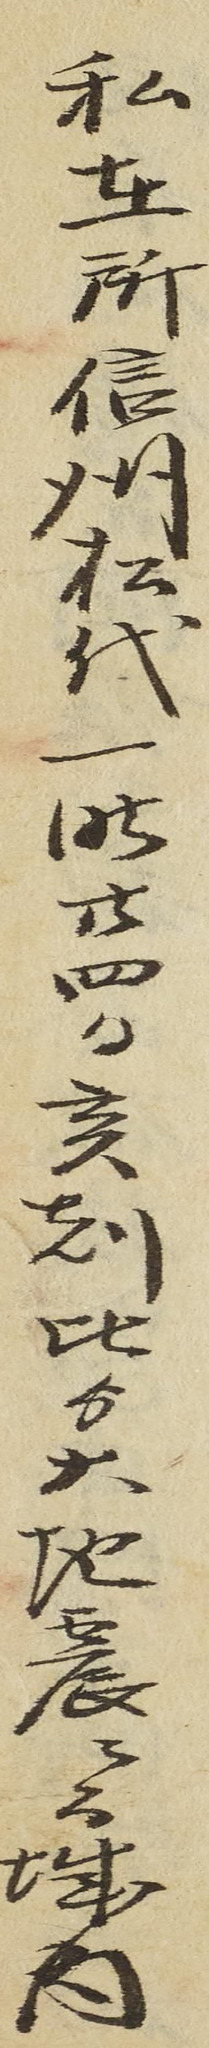私在所信州松代一昨廿四日亥刻比ゟ大地震二而城内

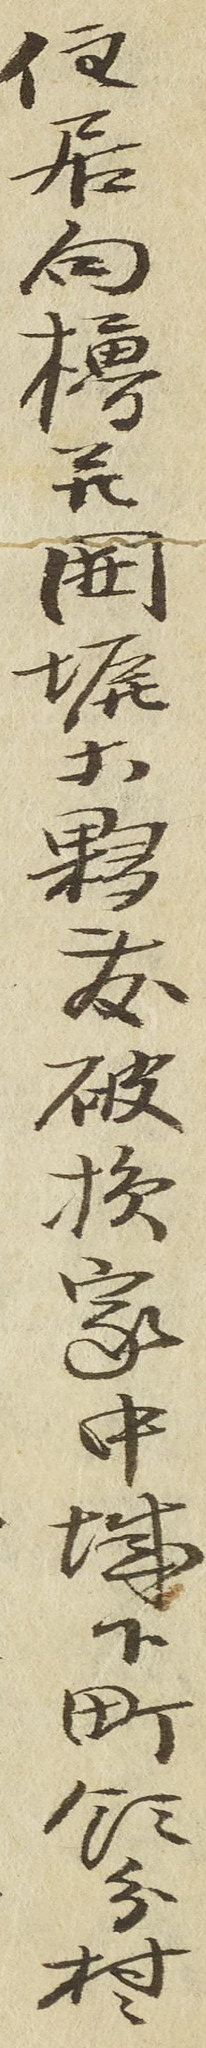住居向櫓并囲塀等夥敷破損家中城下町領分村々
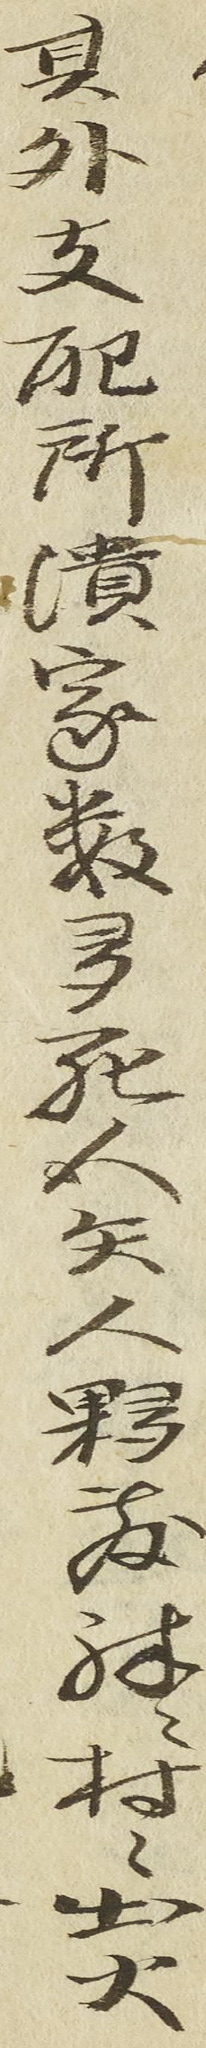其外支配所潰家数多死人矢人夥敷殊二村々出火
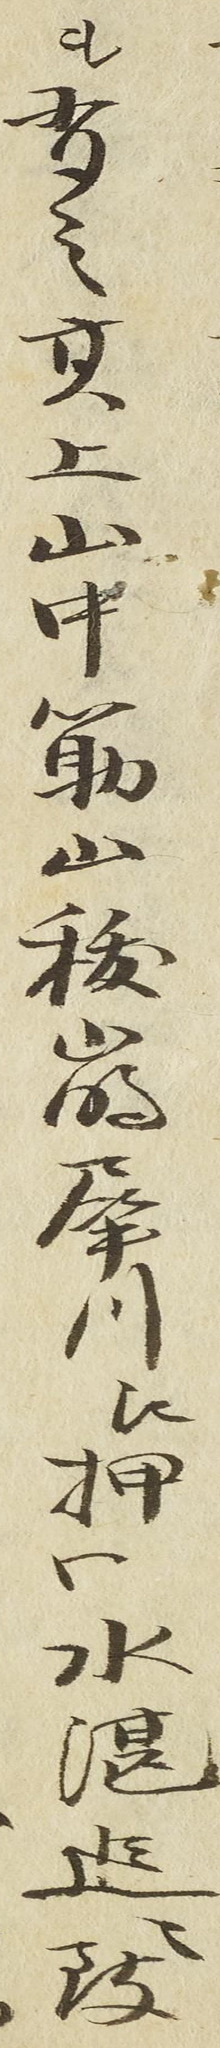も有之其上山中筋山抜崩犀川得押水湛追々致
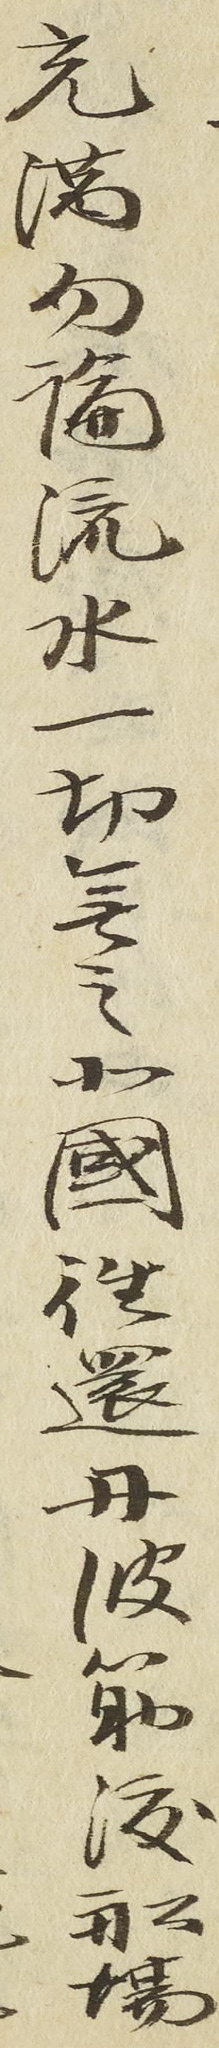充満勿論流水一切無之北国往還丹波筋渡船場
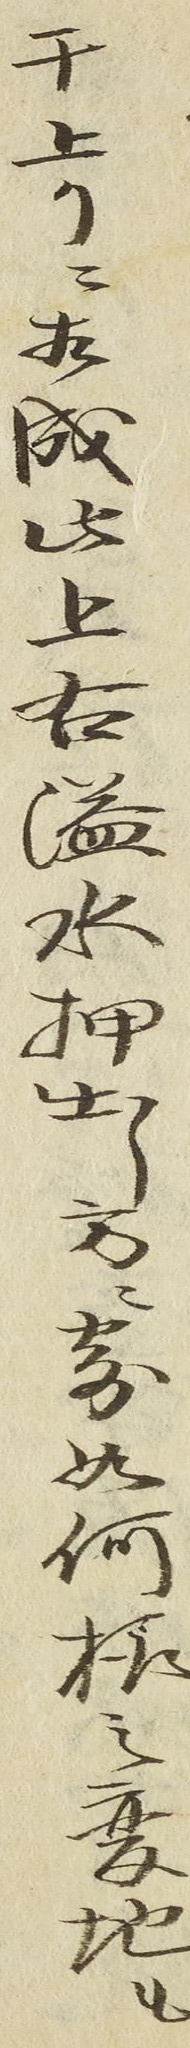干上り二相成此上右溢水押出し方二寄如何様之変地も
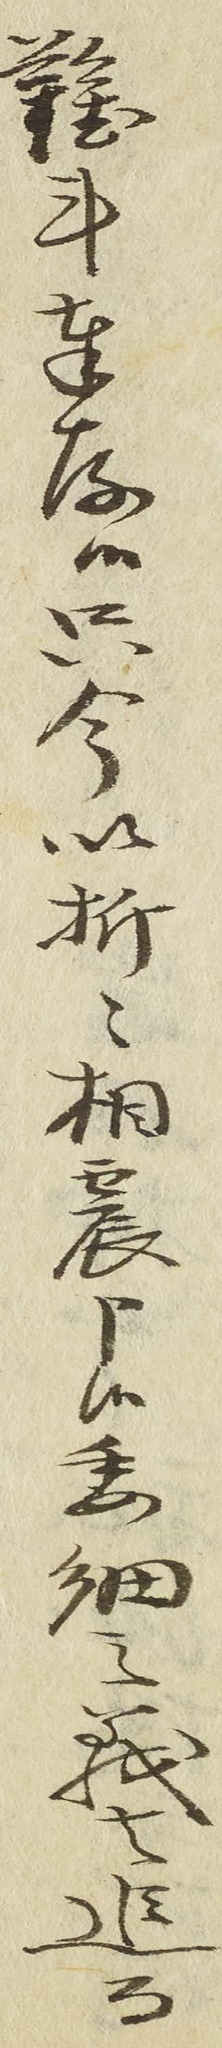難斗奉存候只今以折々相震申候委細之義は追而
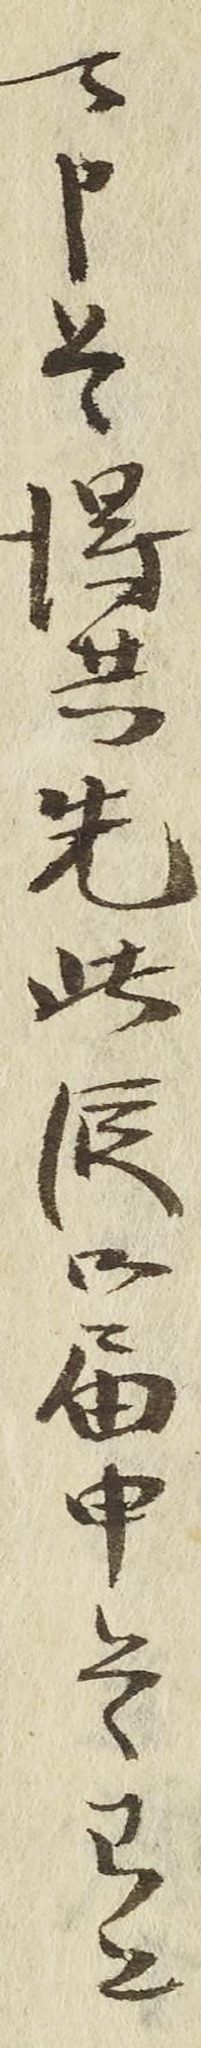可申上候得共先此段御届申上候已上
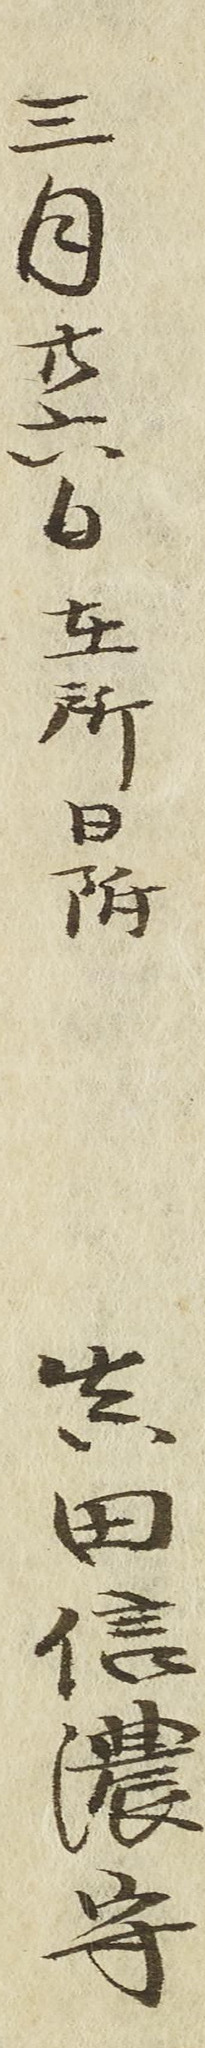三月廿六日在所日附真田信濃守
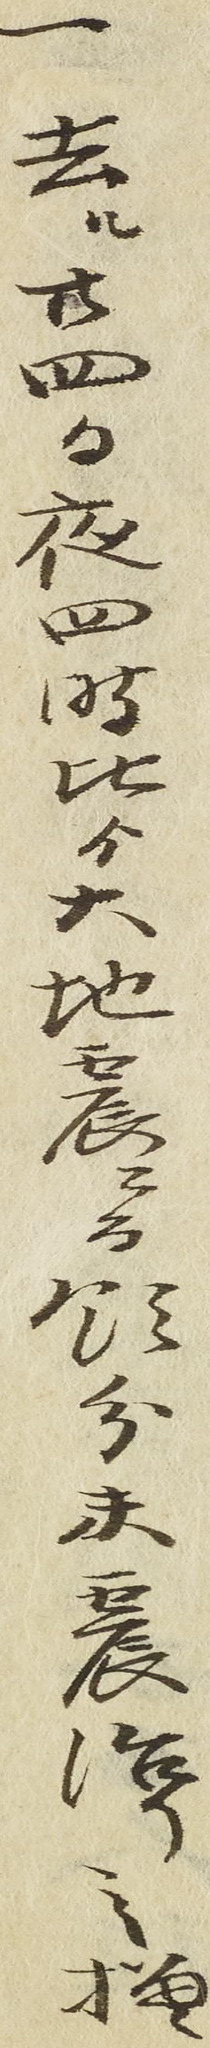一去ㇽ廿四日夜四時比ゟ大地震二而領分未震治り之模
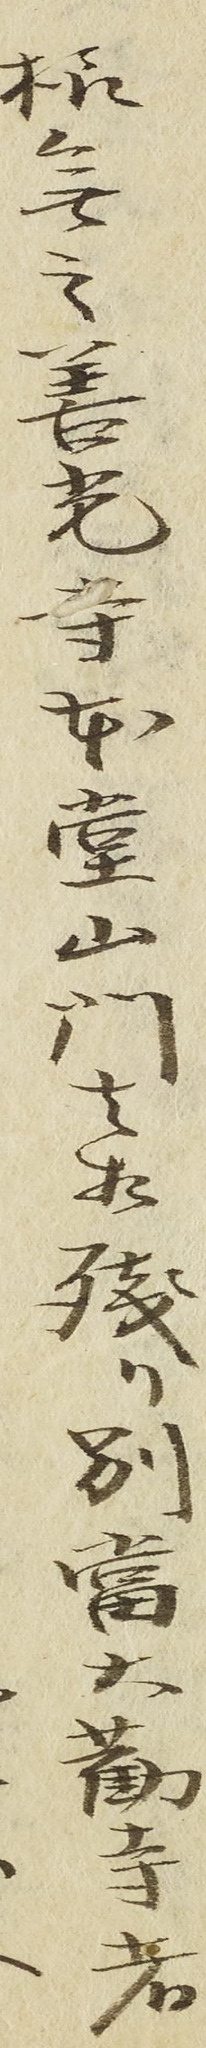様無之善光寺本堂山門は相残り別当大勧寺は
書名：信濃國大地震記　乾
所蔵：東京大学地震研究所図書室 Earthquake Research Institute Library, The University of Tokyo, JAPAN
